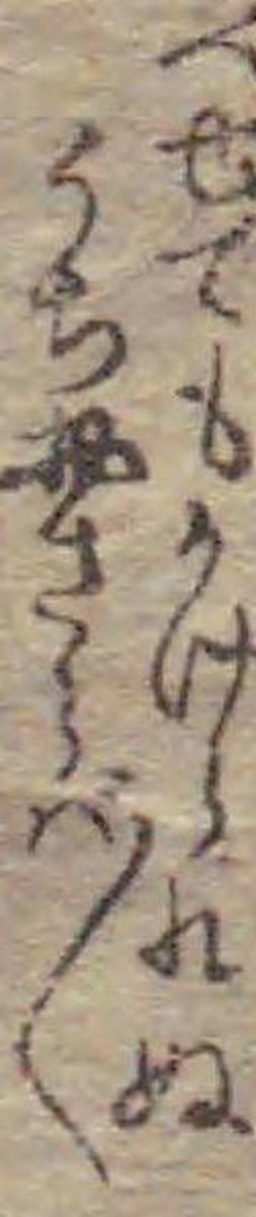うちおさらば〳〵
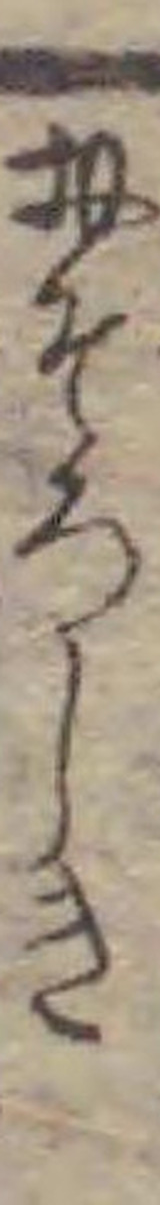おそろしき
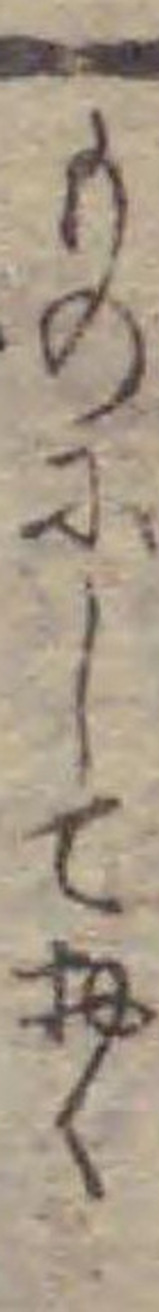ものにしておく
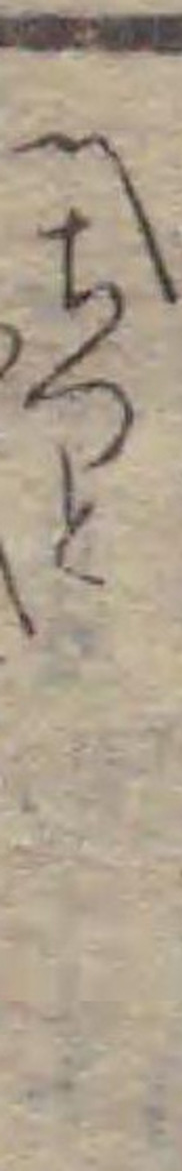〽ちつと
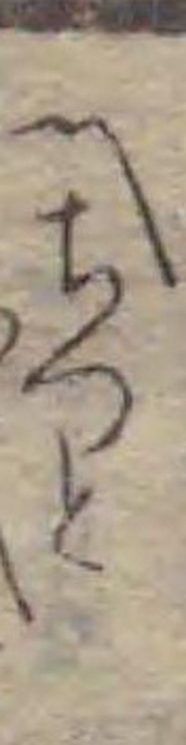〽ちつと
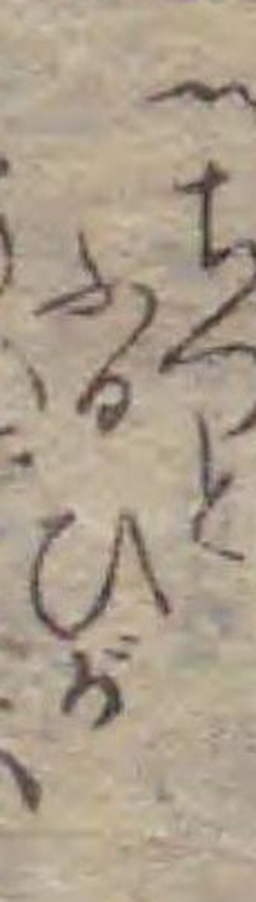ふるひが
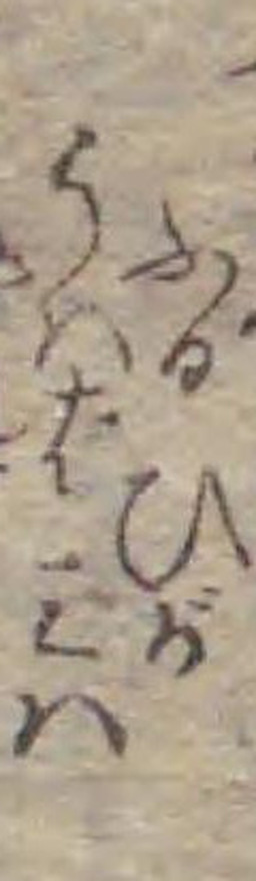うはばみは
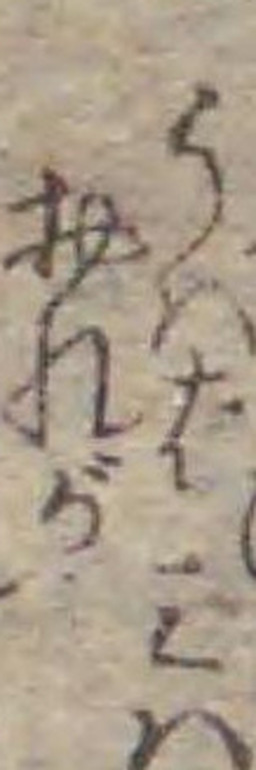おれが
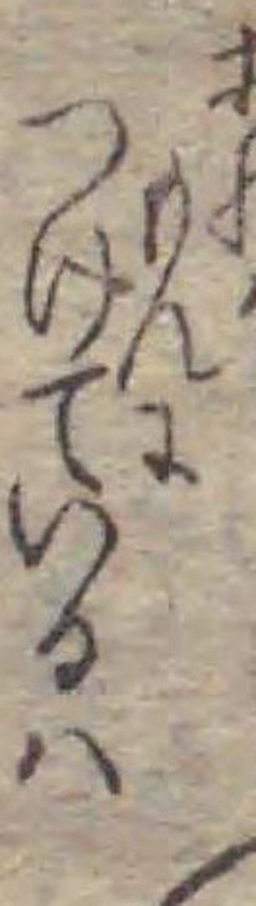つけているは
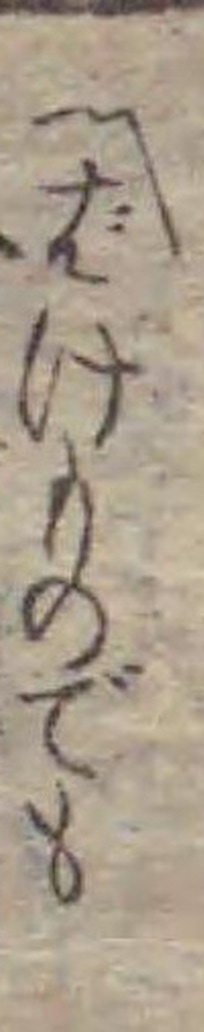〽ばけものでも
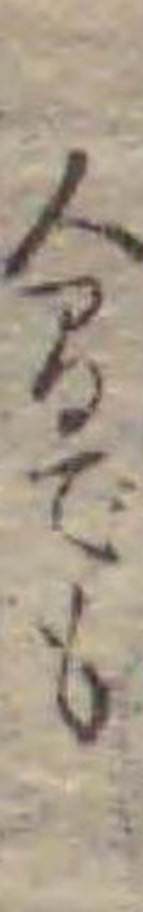人間でも
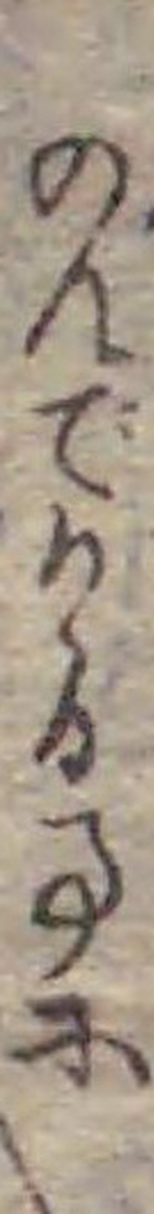のんでかる事に
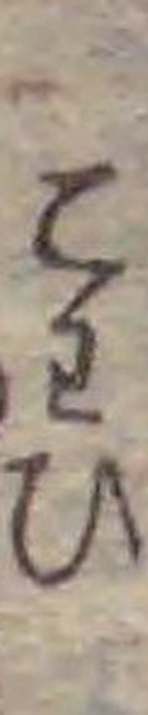こわひ
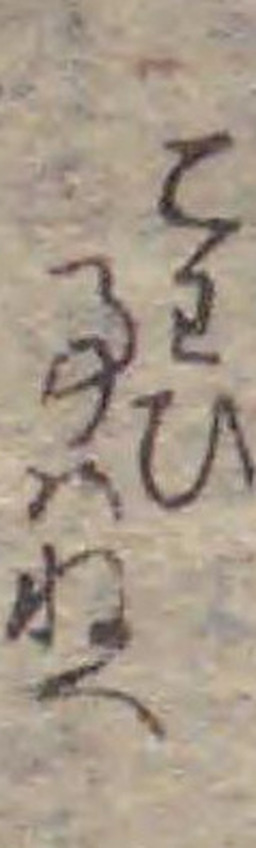事はねへ
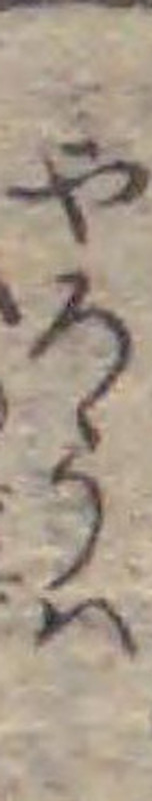やろうは
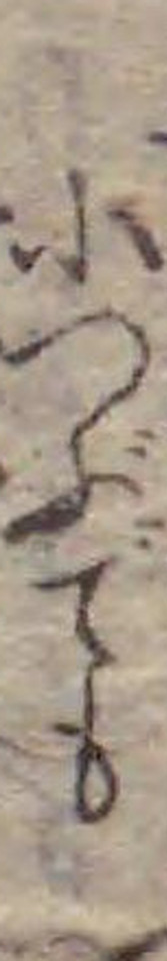小つぶでも
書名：怪物つれつれ草 : 2巻
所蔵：国立国会図書館 National Diet Library, JAPAN
